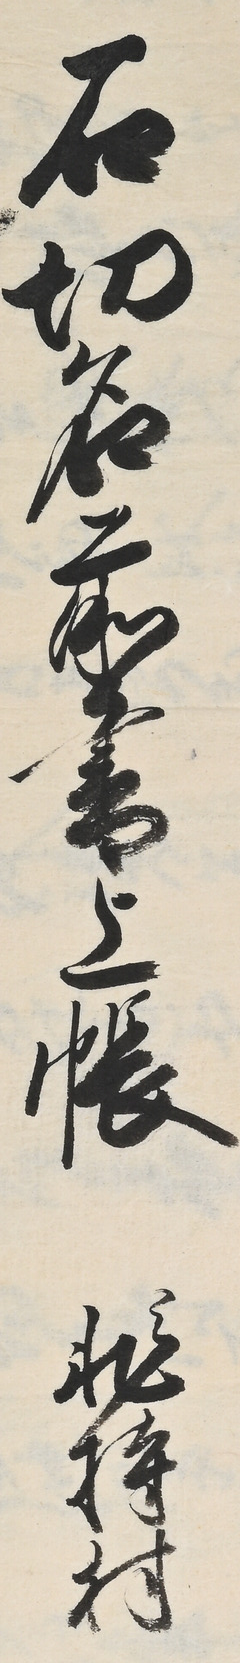石切名前書上帳非持村

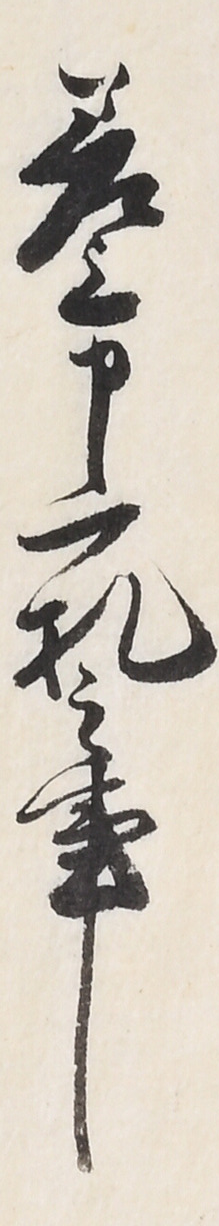差上申一札之事
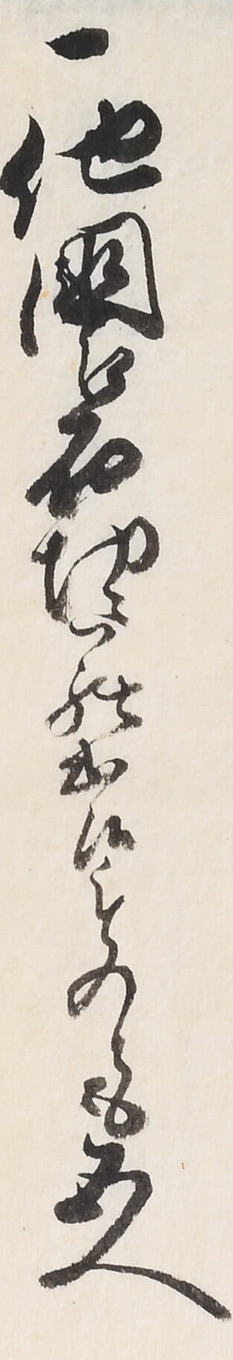一他国江石切ニ罷出候ものとも五人
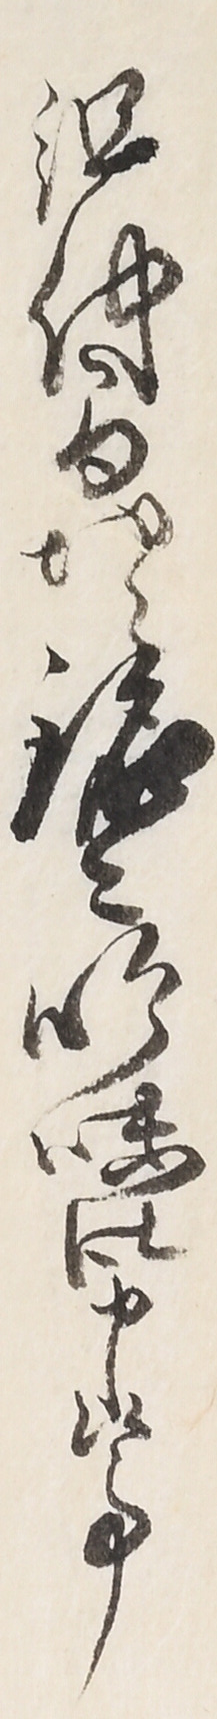組仲間切々銘々吟味仕申候事
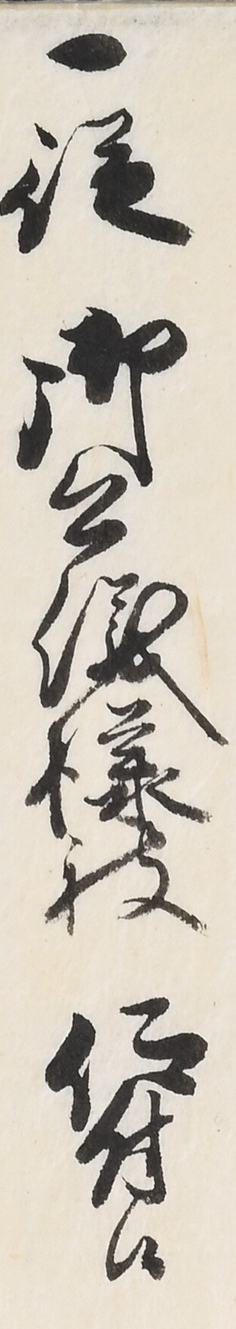一従御公儀様被仰付候
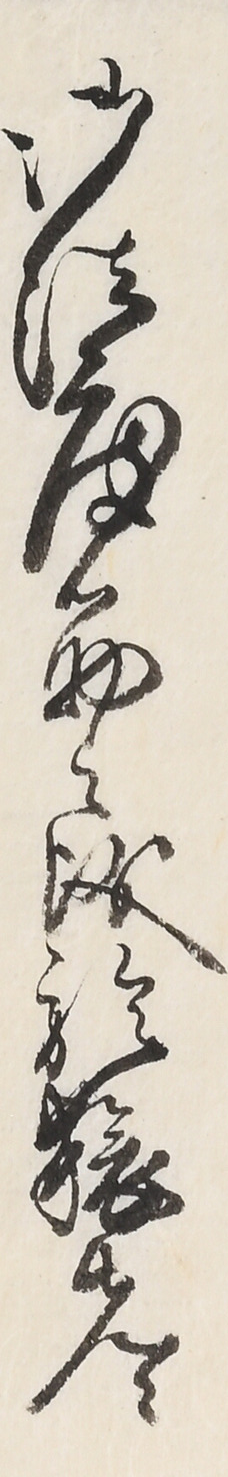御法度筋之儀於旅先ニ
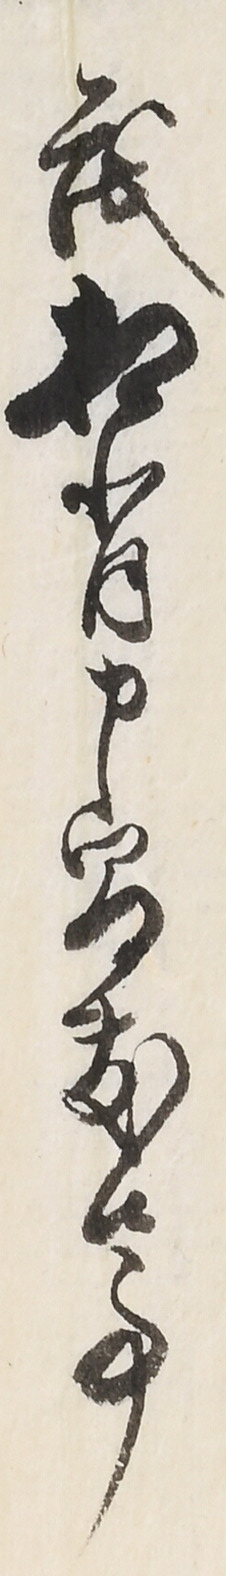茂相背申間敷候事
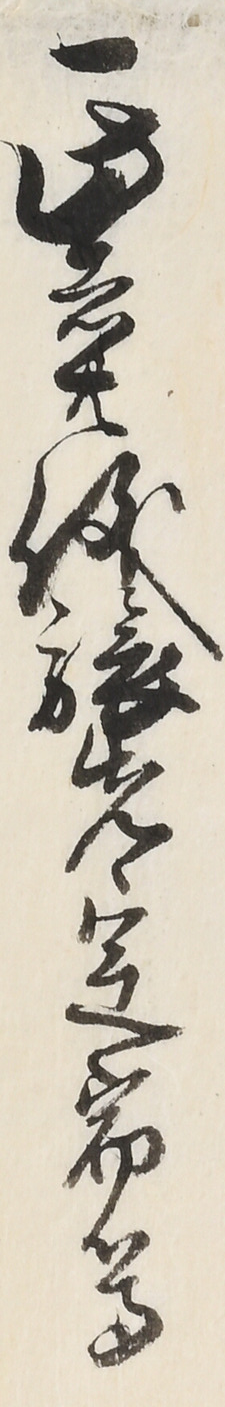一此者共儀旅先定宿等
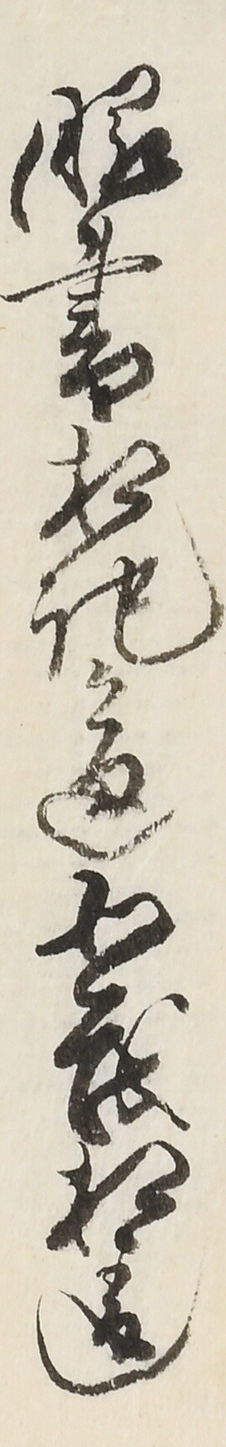脇書相記候通少茂相違
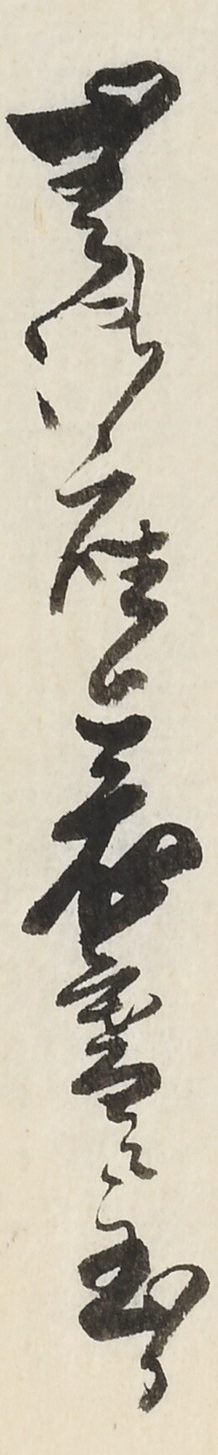無御座候若暮ニ至リ
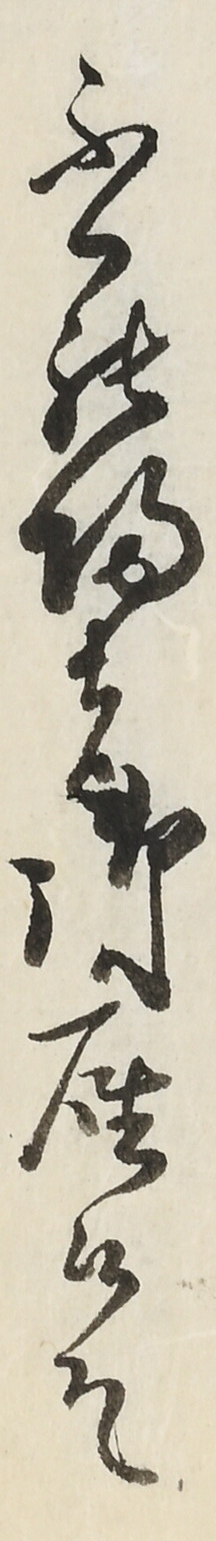不罷帰者御座候ハヽ
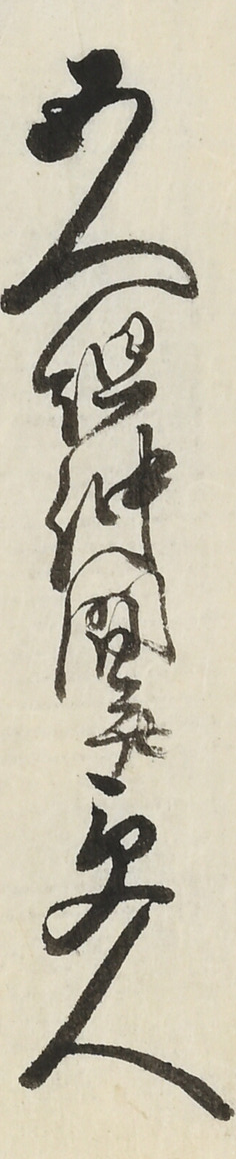五人組仲間并受人
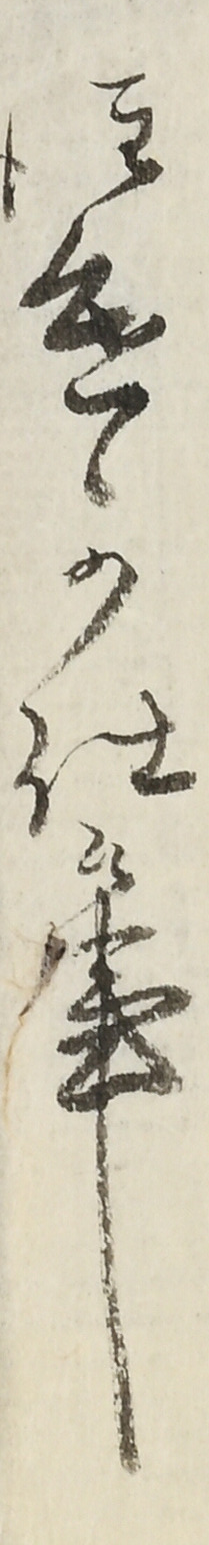注進可仕候事

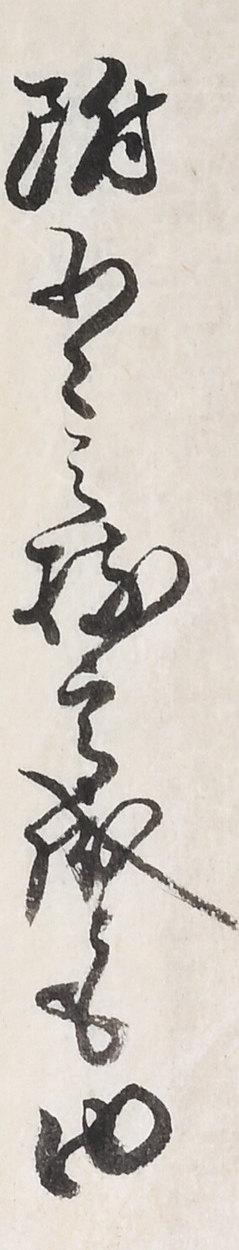附少々之持高成とも田
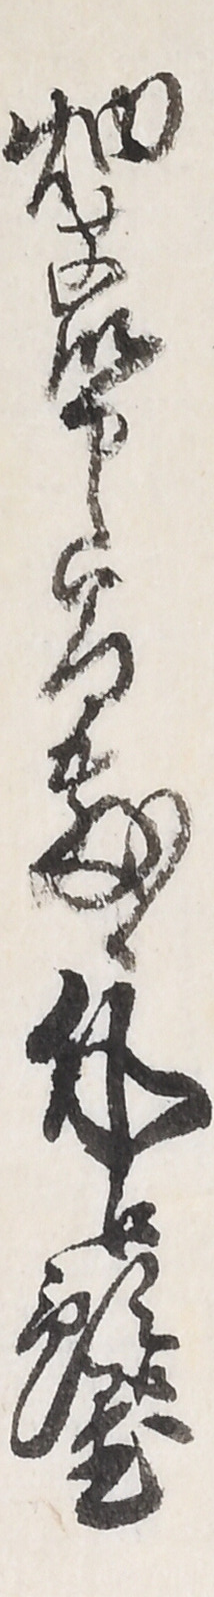畑荒申間敷候外江預ケ置
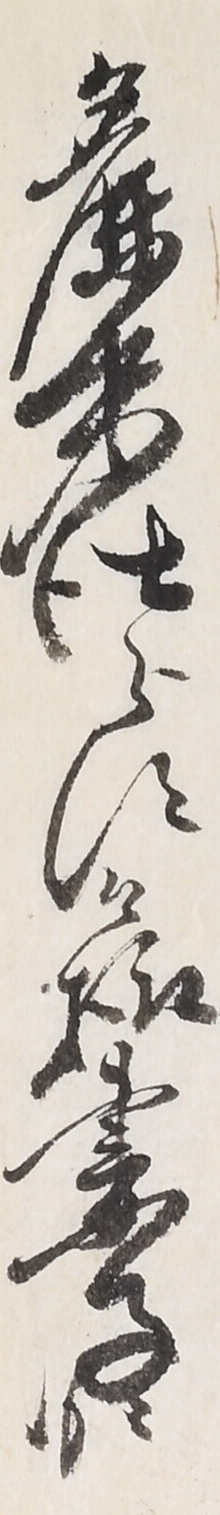麤末仕らす候様妻子ニも
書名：元治二乙丑年二月石切名前書上帳
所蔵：伊那市立高遠町図書館・合同会社AMANE
